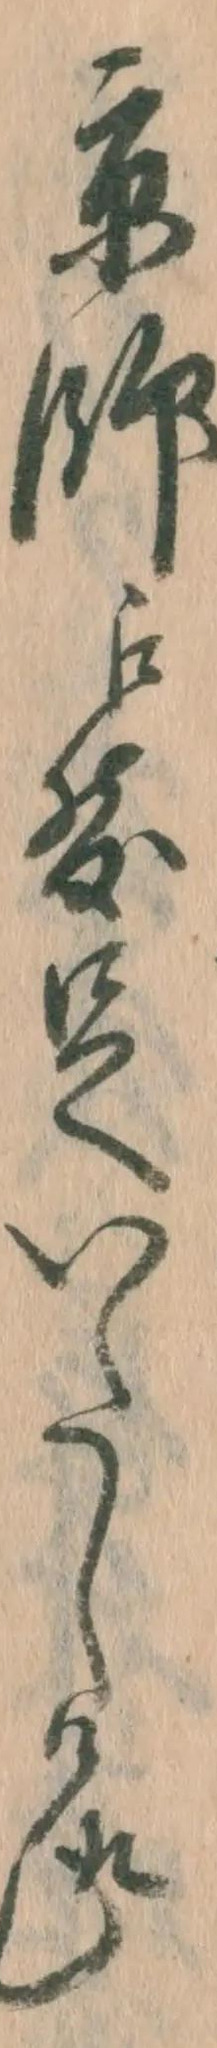京師江発足いたし候趣
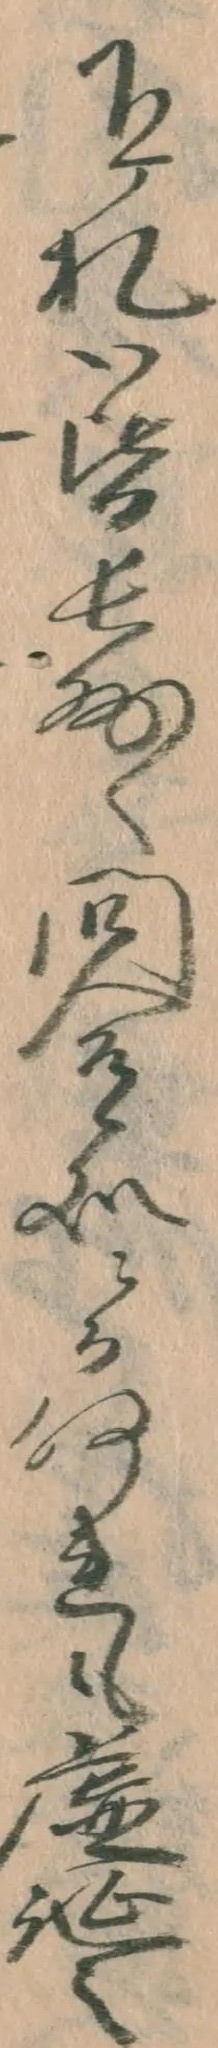下ケ札ハ皆長州へ問合候処ニ而何れも虚誕之
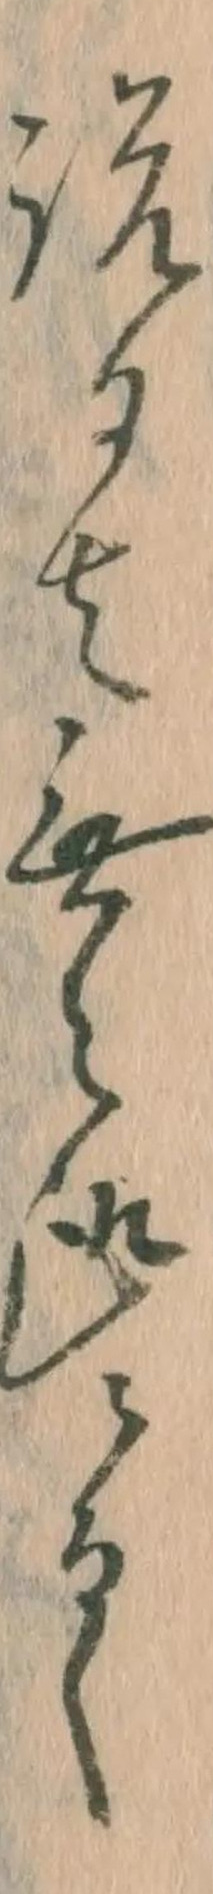説に者無之趣ニ而候

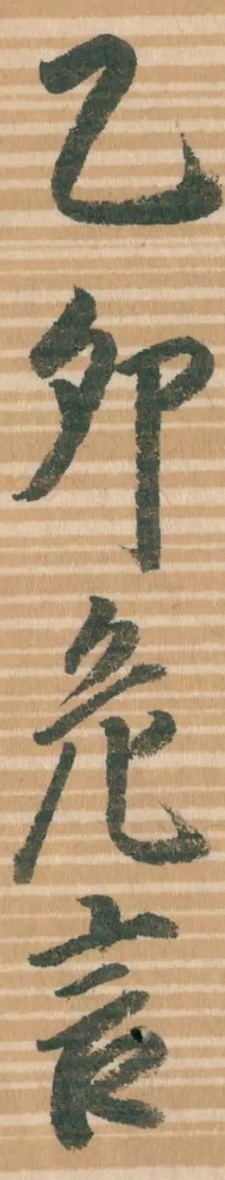乙卯危言

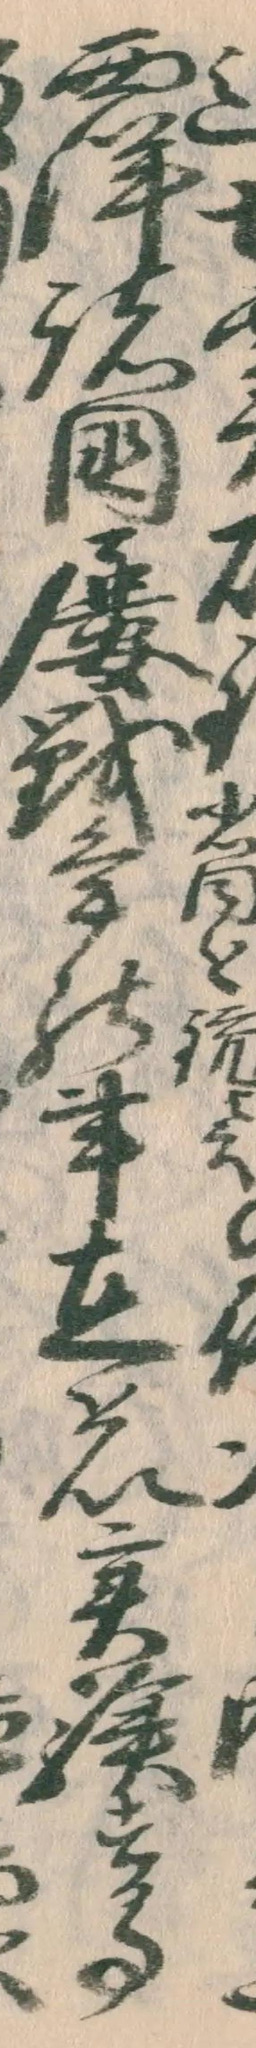西洋諸国屢戦争の事在を以実験する事
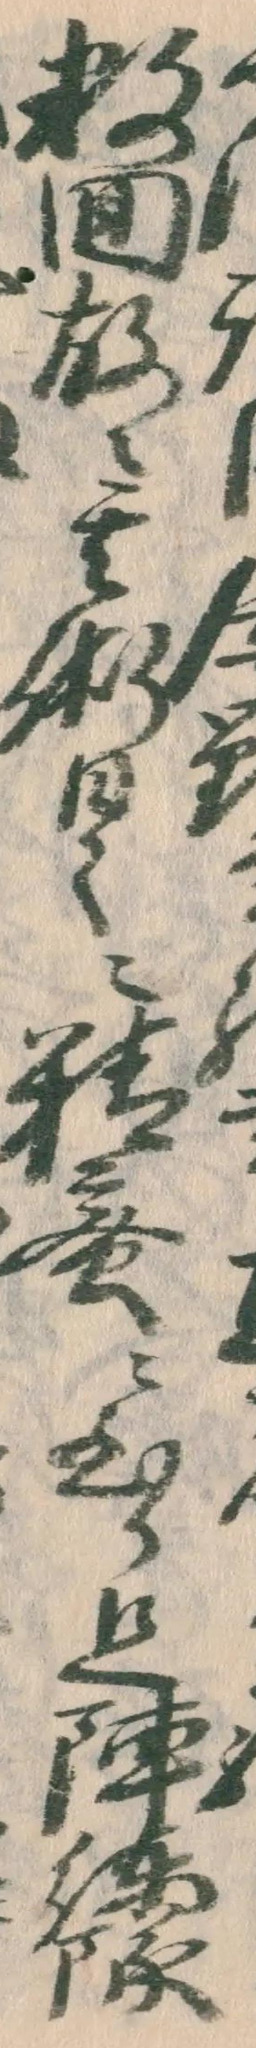数回故ニ其術日々ニ精密ニ至り且陣練隊
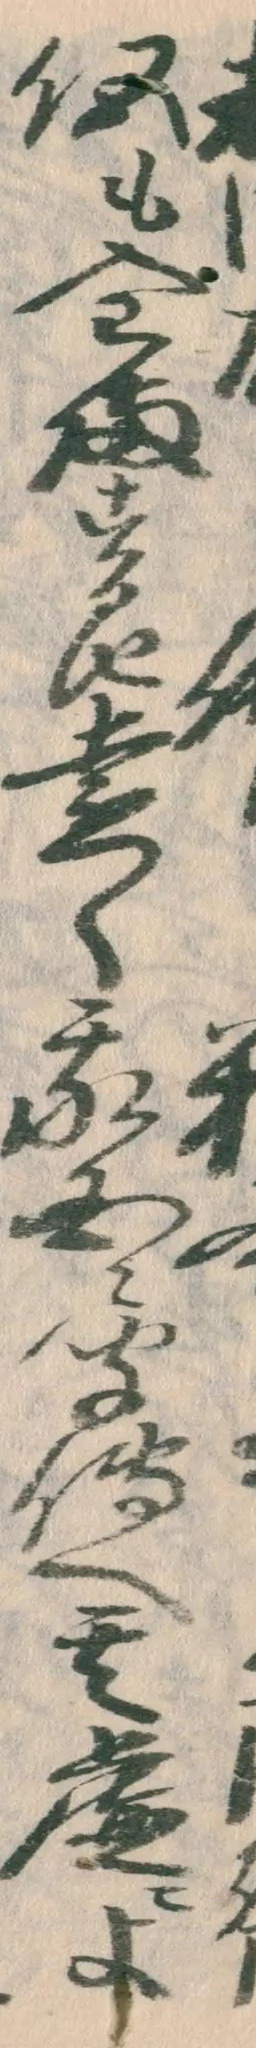伍も全備する由遠く我国ニ聞傳へ其慮ニよ
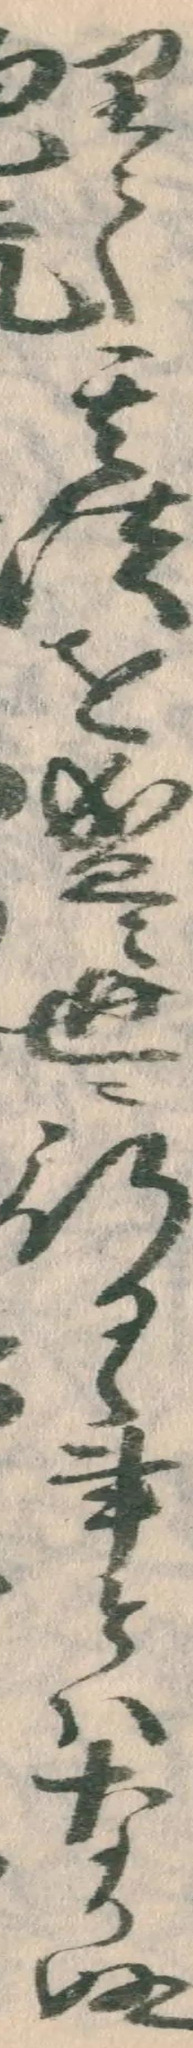りて其法を盛ニ世ニ行るゝ事とハなりぬ
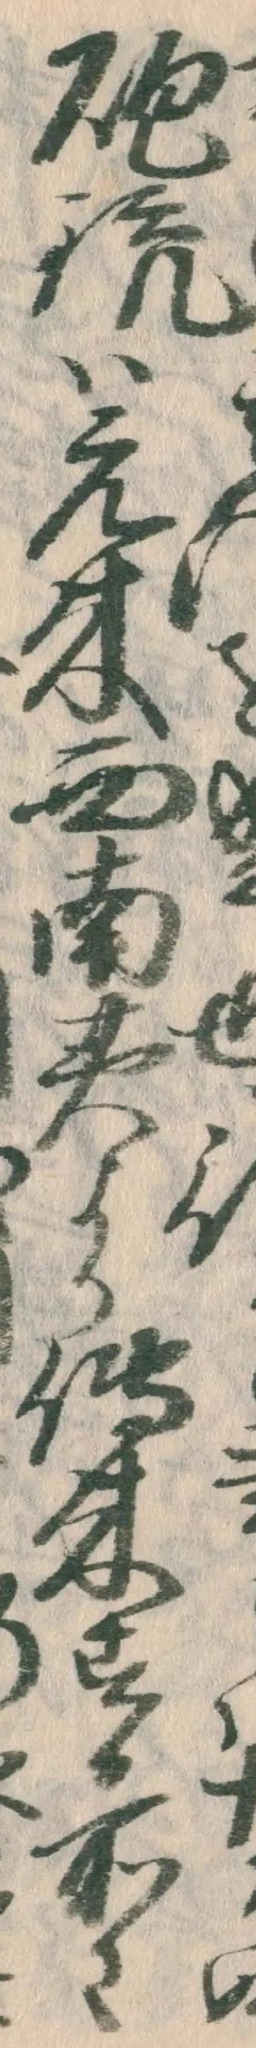砲銃ハ元来西南夷より傳来する所に
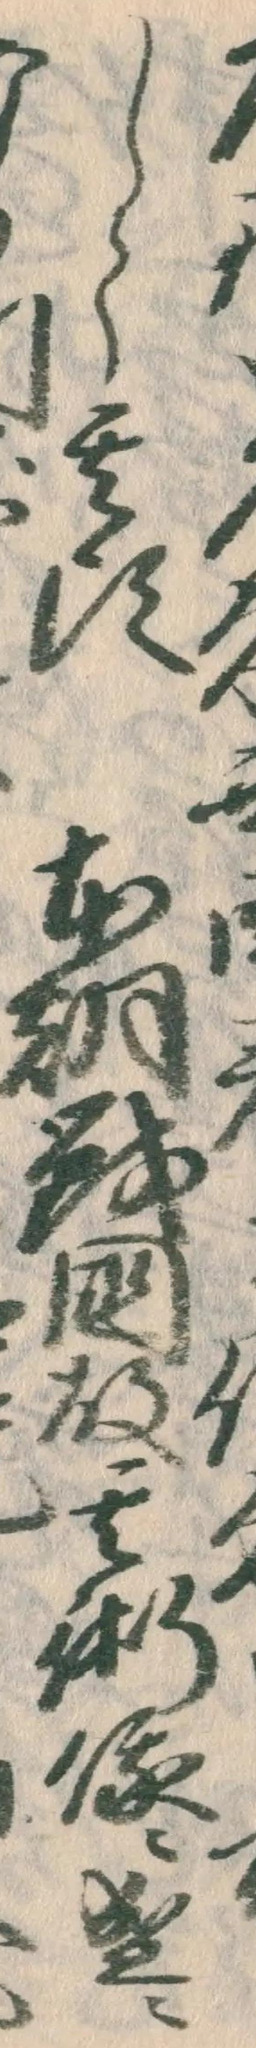して其頃本朝戦国故其術俄ニ盛ニ
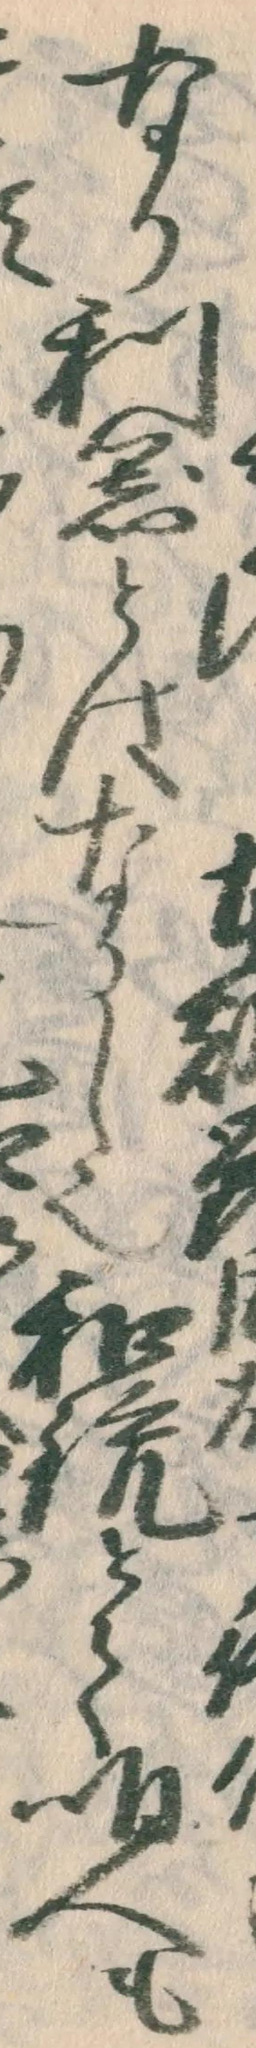なり利器とはなりし也和銃とて明人も
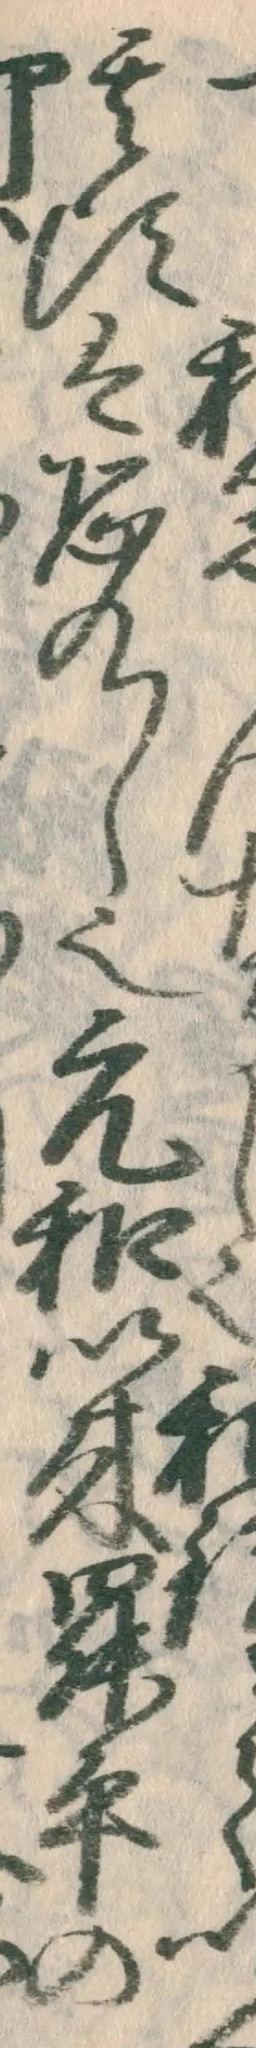其頃は恐入し也元和以来昇平の
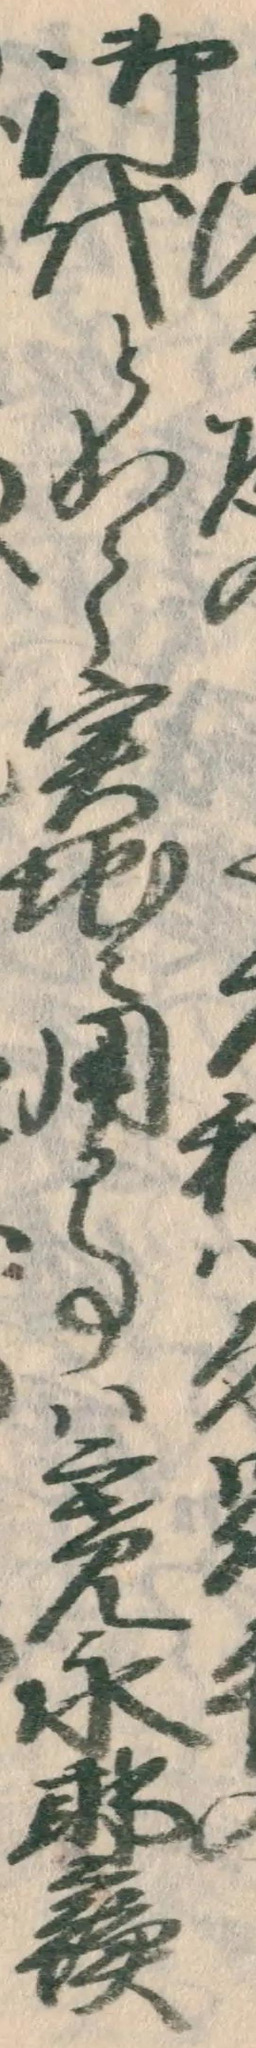御代と成て実地ニ用る事ハ寛永耶蘇
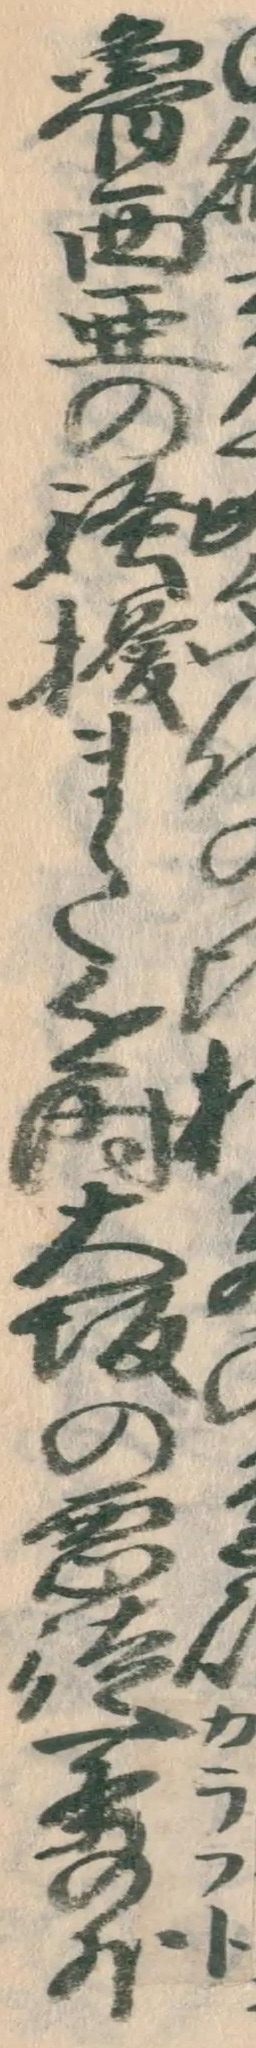魯西亜の騒櫌また近時大坂の悪徒一条の外

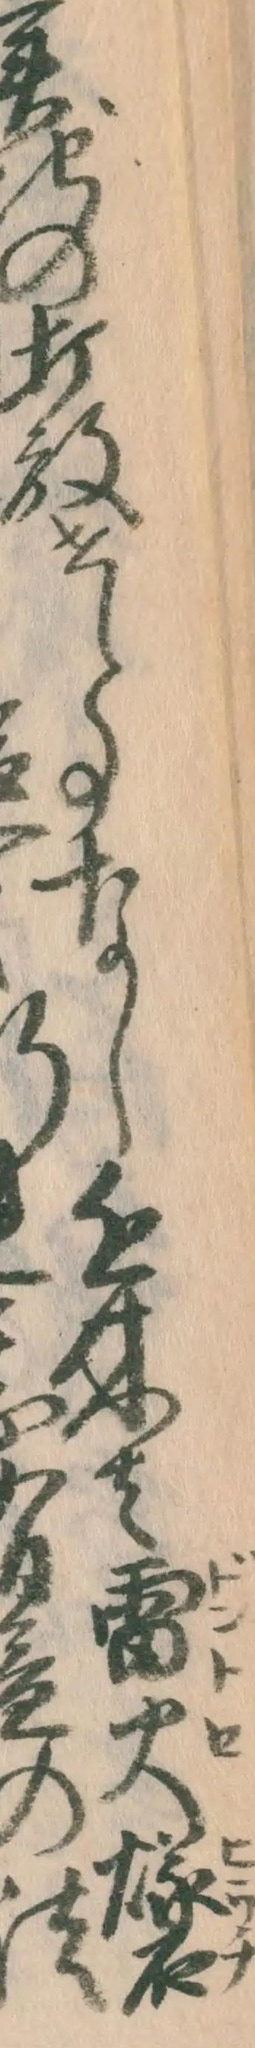実地の打放せし事なし近来者雷火燧石
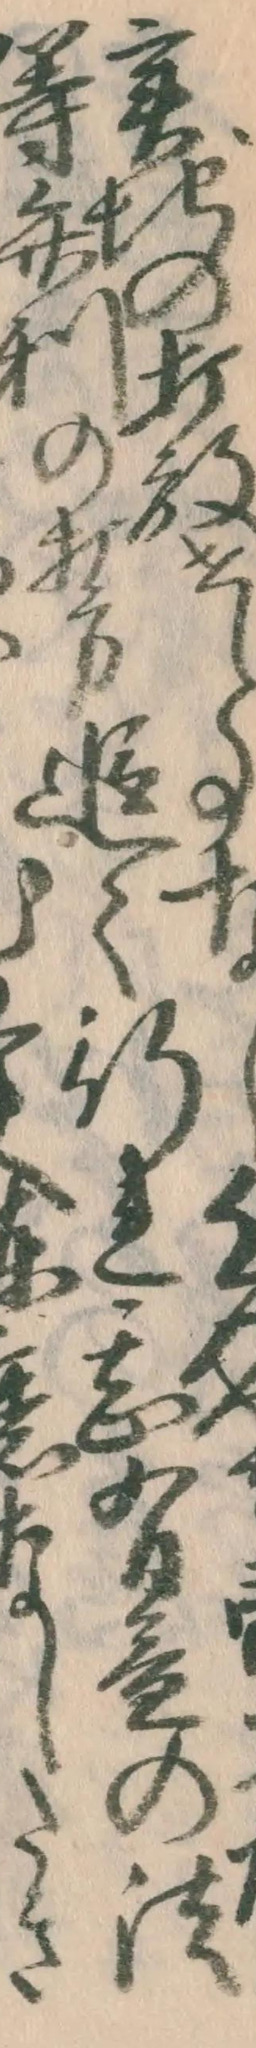等弁利の打方追々行れ甚有益の法
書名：麗斎叢書. 20
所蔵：国立国会図書館 National Diet Library, JAPAN
